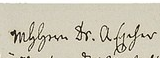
MHHerr Dr. A. Escher
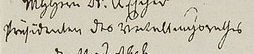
Präsidenten des Verwaltungsrathes
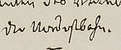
der Nordostbahn.
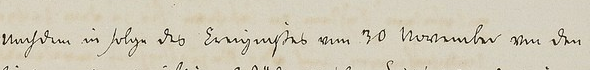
Nachdem in Folge des Ereignißes vom 30 November von den
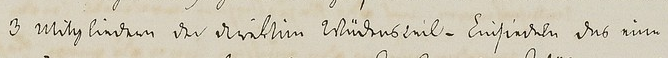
3 Mitgliedern der Direktion Wädensweil–Einsiedeln das eine
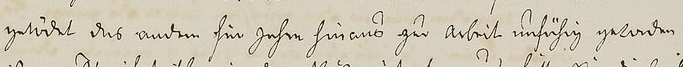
getödet das andere für Jahre hinaus zur Arbeit unfähig geworden
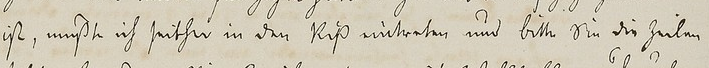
ist, mußte ich seither in den Riß eintreten und bitte Sie die Zeilen
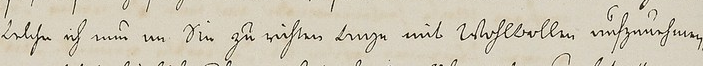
welche ich nun an Sie zu richten wage mit Wohlwollen aufzunehmen,
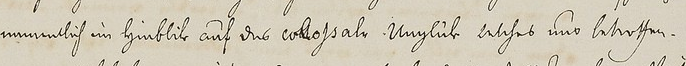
namentlich im Hinblik auf das colossale Unglük welches uns betroffen.
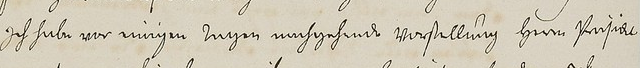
Ich habe vor einigen Tagen nachgehende Vorstellung Herrn Präsidt
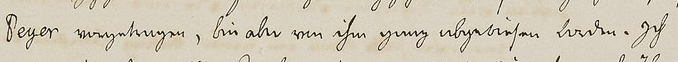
Peyer vorgetragen, bin aber von ihm ganz abgewiesen worden. Ich
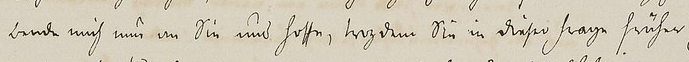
wende mich nun an sie und hoffe, trotzdem Sie in dieser Frage früher
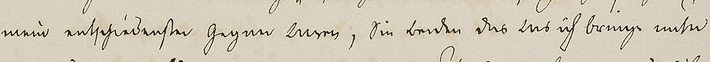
mein entschiedenster Gegner waren, Sie werden das was ich bringe unter
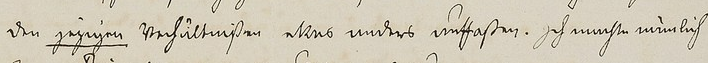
den jezigen Verhältnißen etwas anders auffaßen. Ich machte nämlich
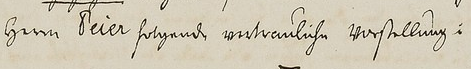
Herrn Peier folgende vertrauliche Vorstellung:
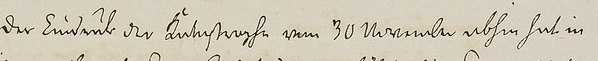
Der Eindruk der Katastrophe vom 30 November abhin hat in
